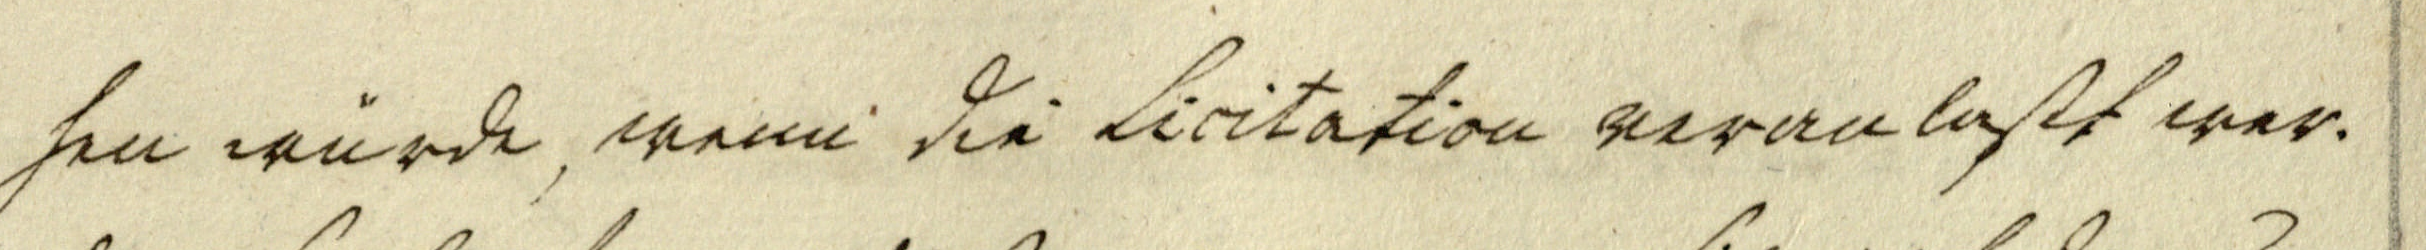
hen würde, wenn die Licitation veranlaßt wer¬
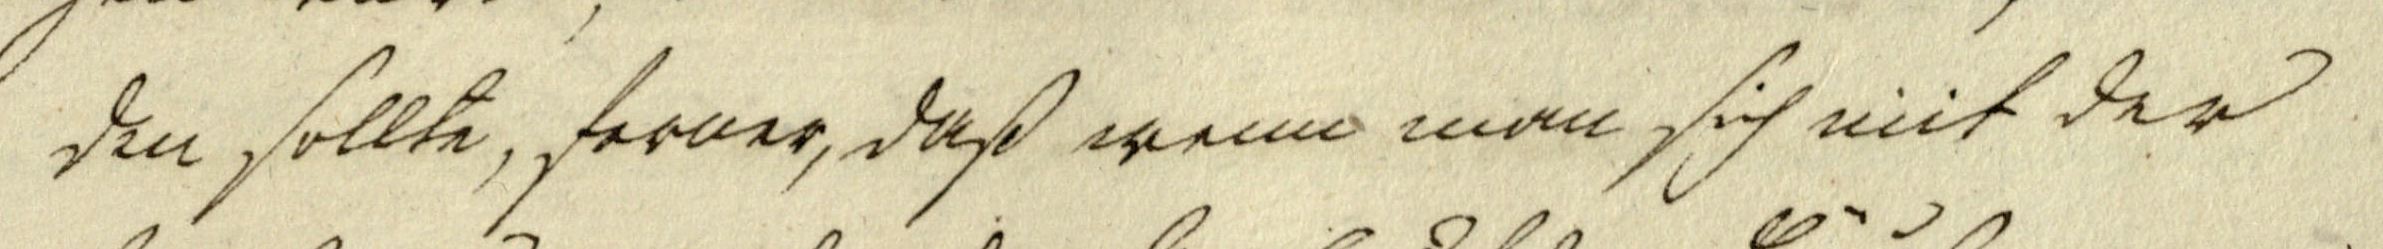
den sollte, ferner, daß wenn man sich mit der
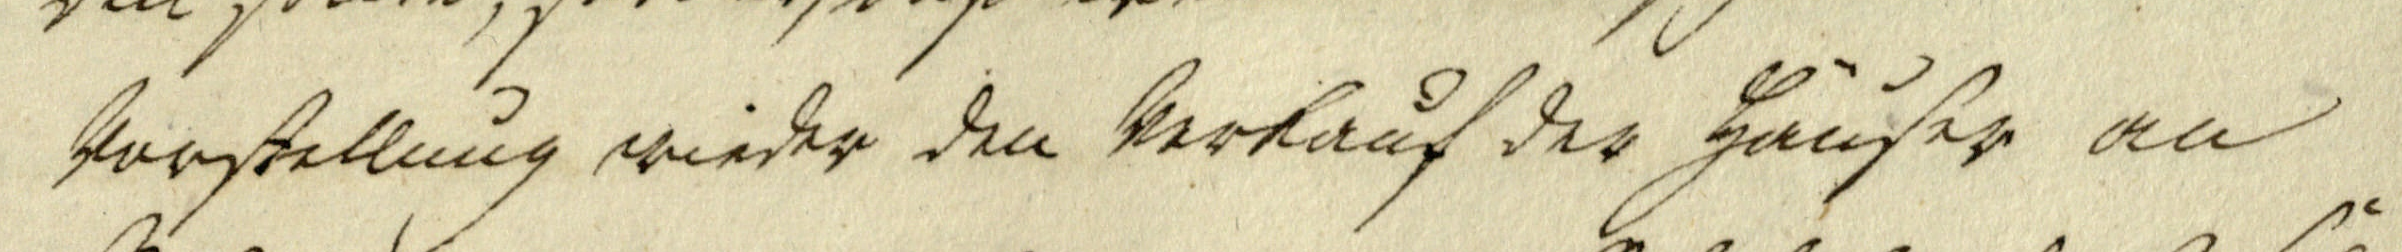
Vorstellung wieder den Verkauf der Häuser an
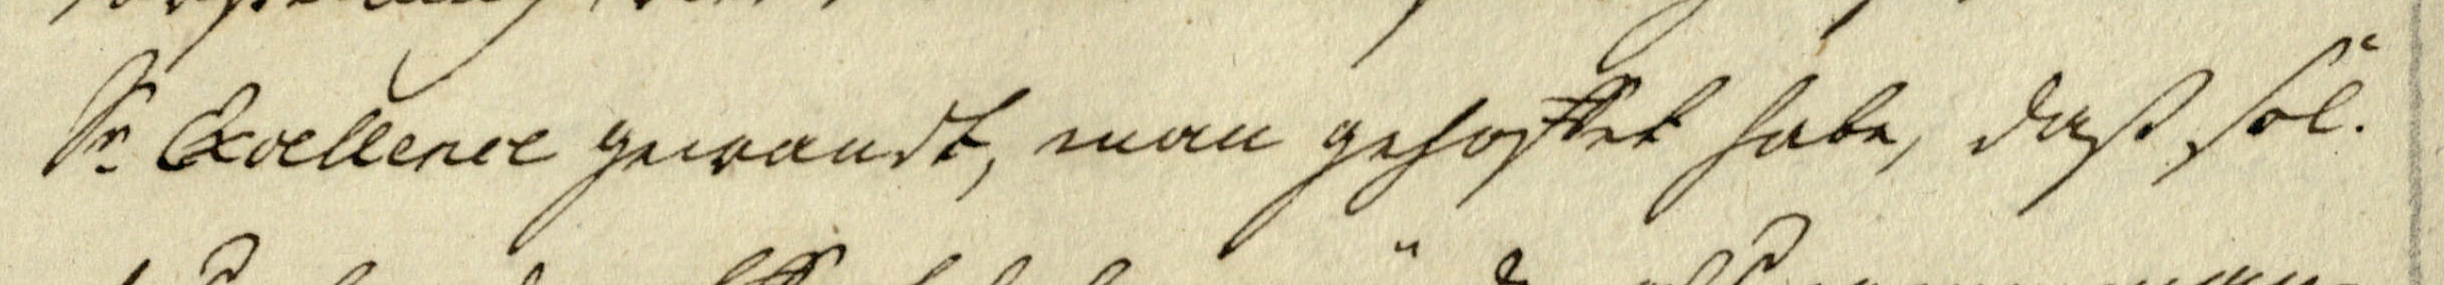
Sr Excellence gewandt, man gehoffet habe, daß sol¬
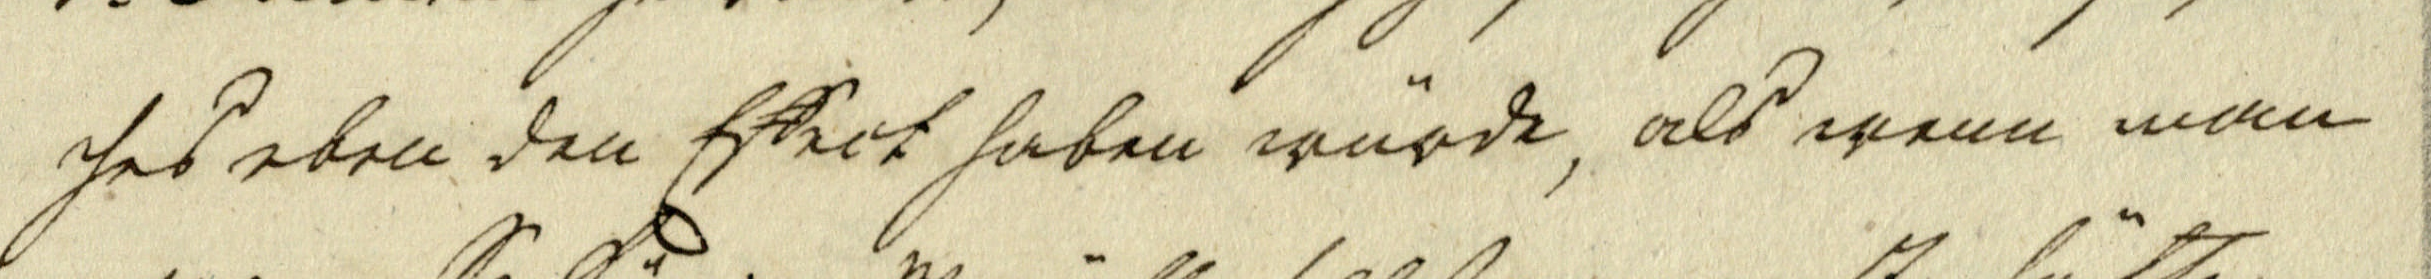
ches eben den Effect haben würde, als wenn man
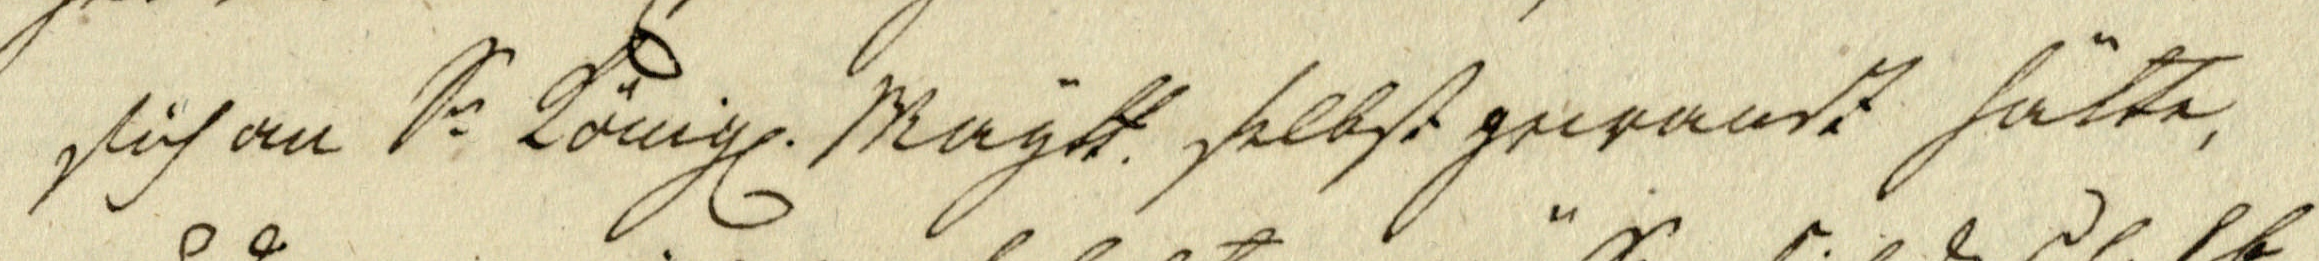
sich an Sr Königl. Maÿtt. selbst gewandt hätte,
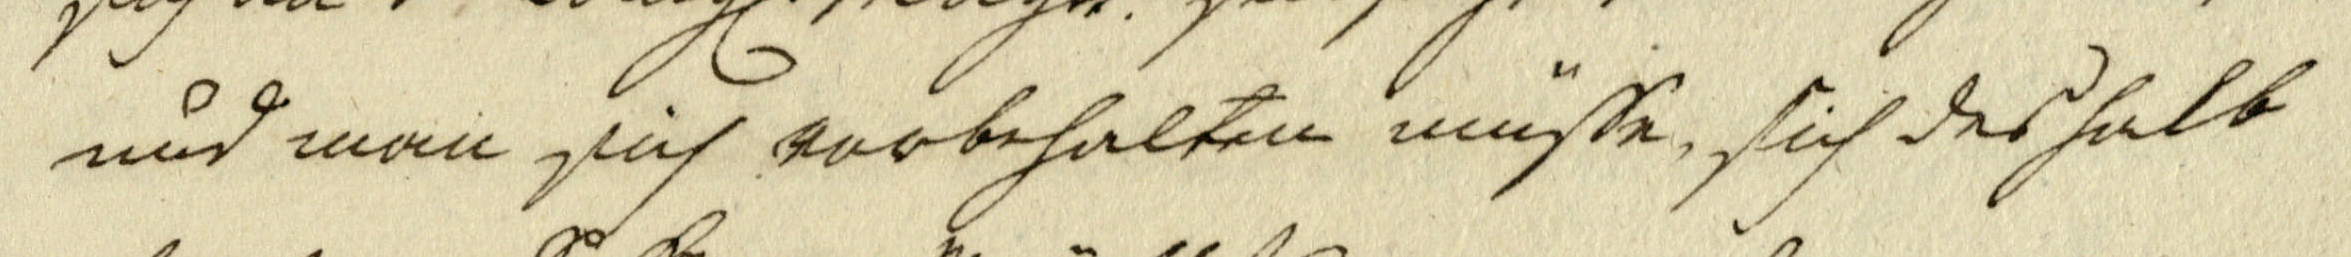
und man sich vorbehalten müsse, sich deshalb
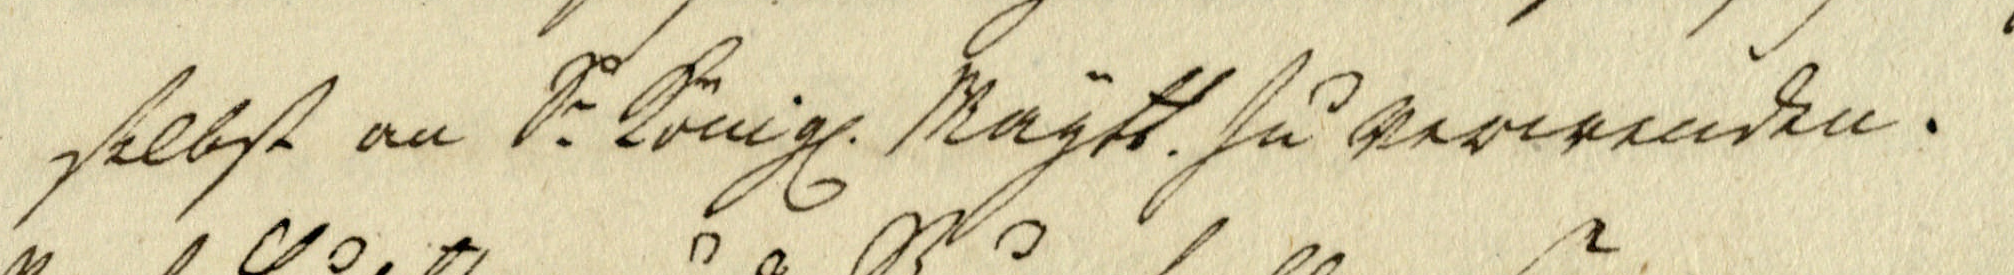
selbst an Sr. Königl. Maÿtt. zu verwenden.
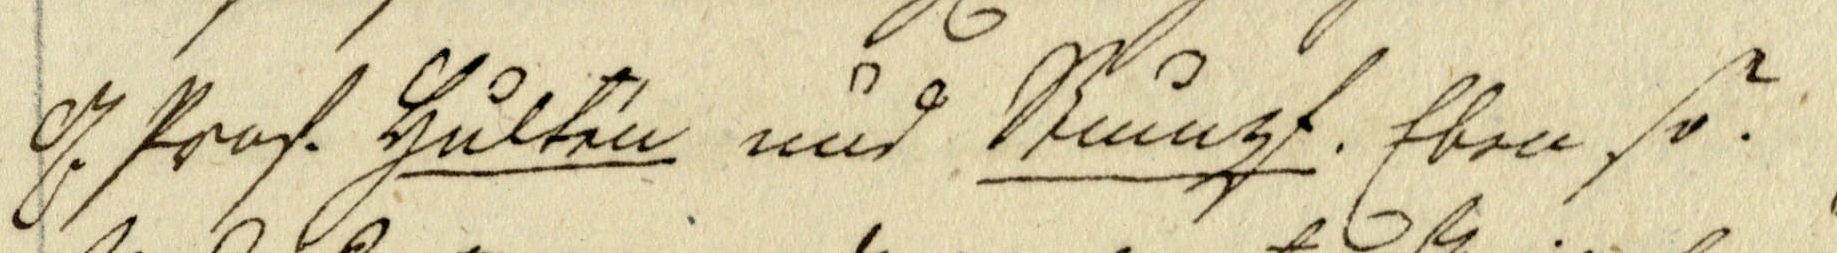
dh. Prof. Hultén und Stumpf. Eben so.
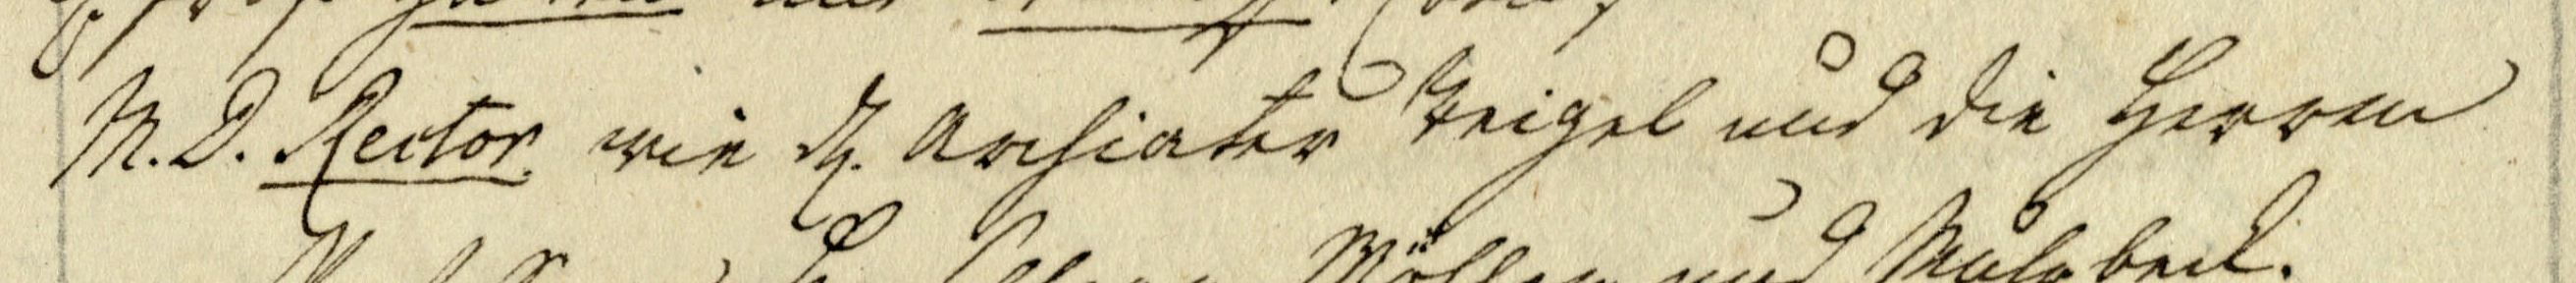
M D. Rector wie dh. Archiater Weigel und die Herren
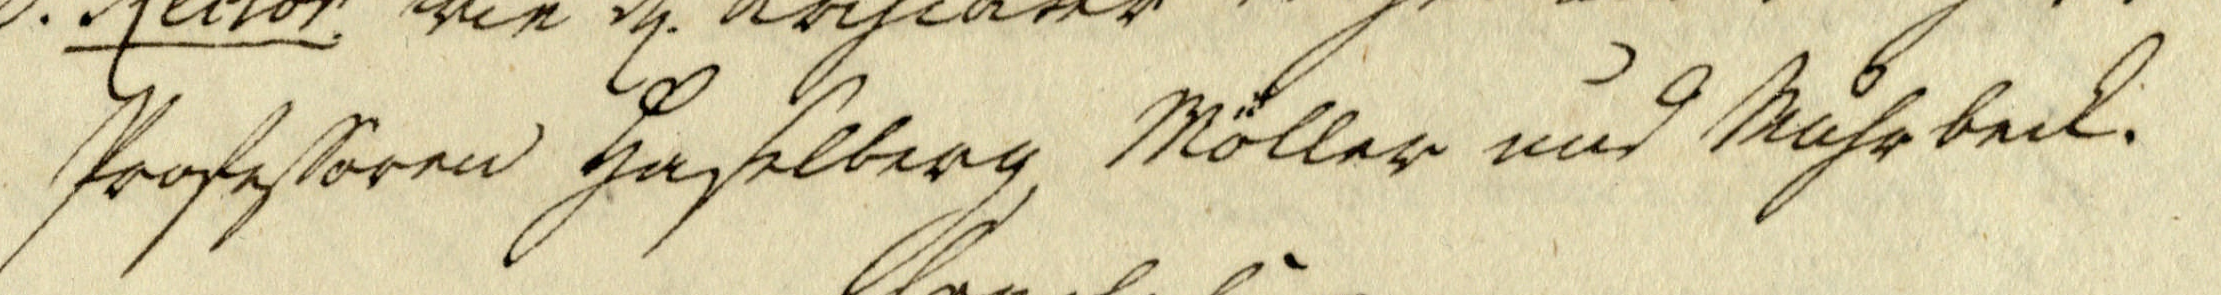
Professoren Haselberg, Möller und Muhrbeck.
